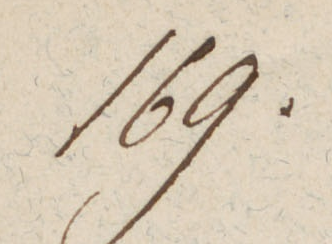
169.
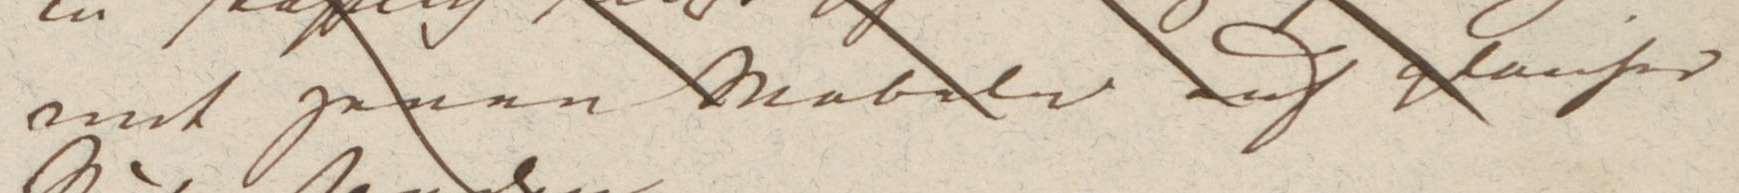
mit jenen Mobeln auf gleicher
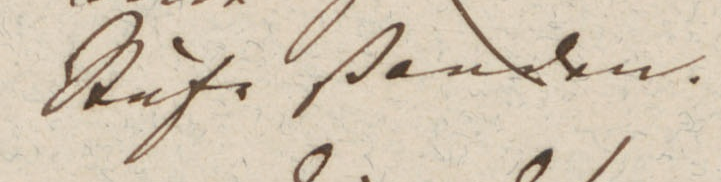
Stufe standen.
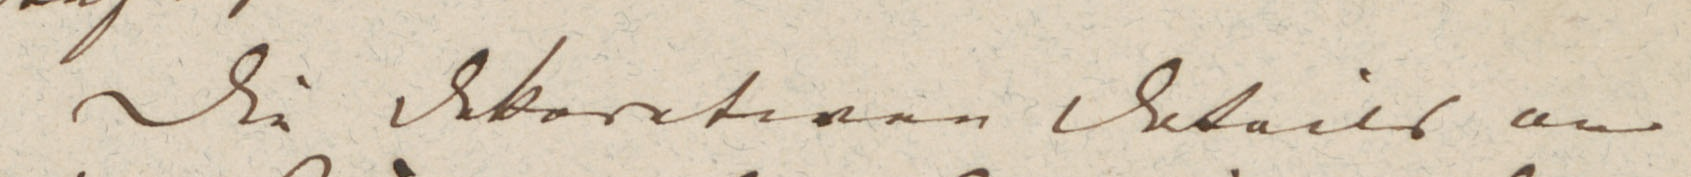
Die dekorativen Details an
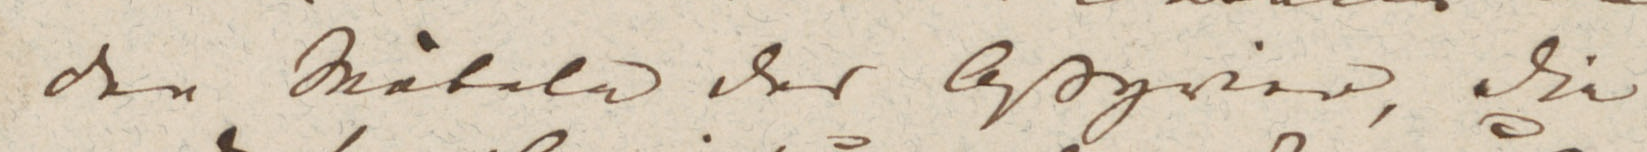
den Möbeln der Assyrier, die
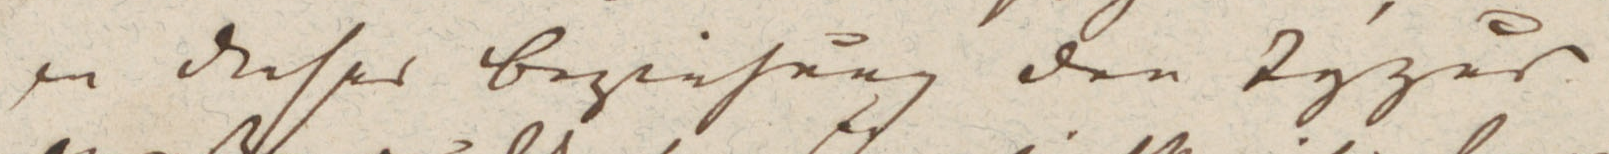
in dieser Beziehung den Typus
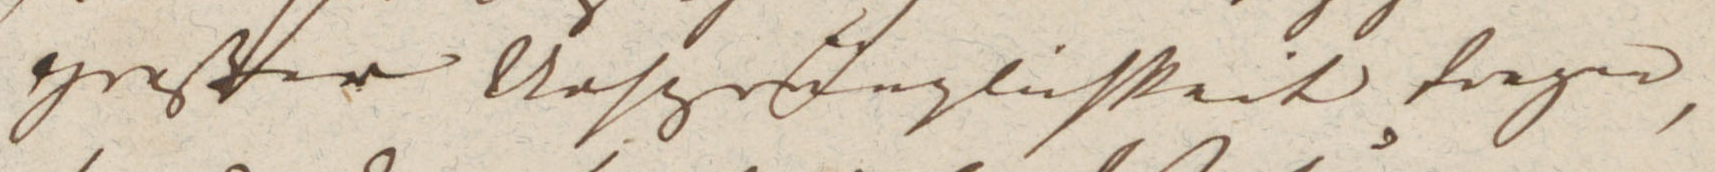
grosser Ursprünglichkeit tragen,
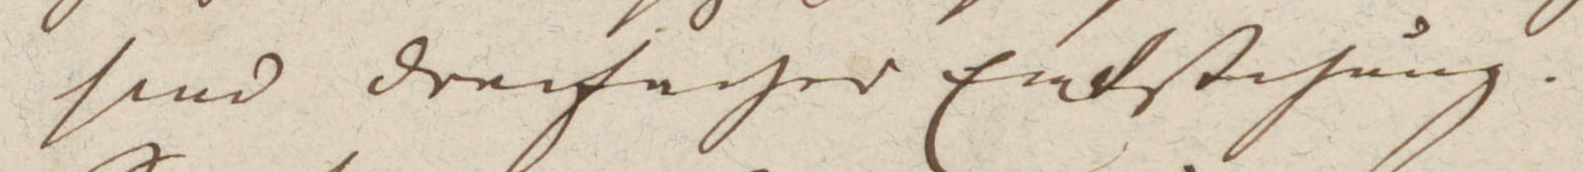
sind dreifacher Entstehung.
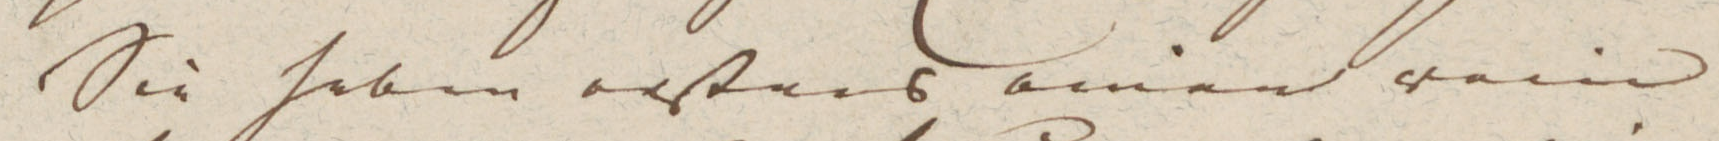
Sie haben erstens einen rein
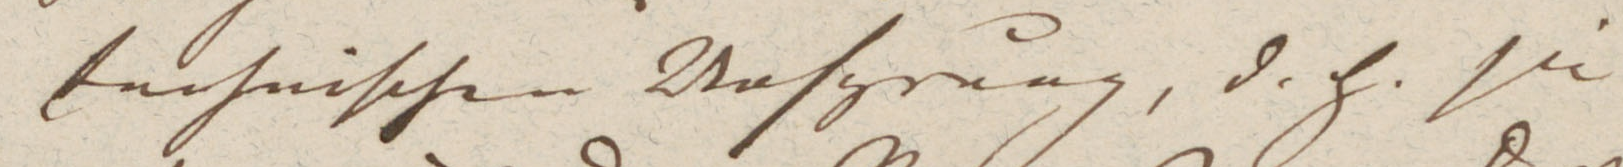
technischen Ursprung, d. h. sie
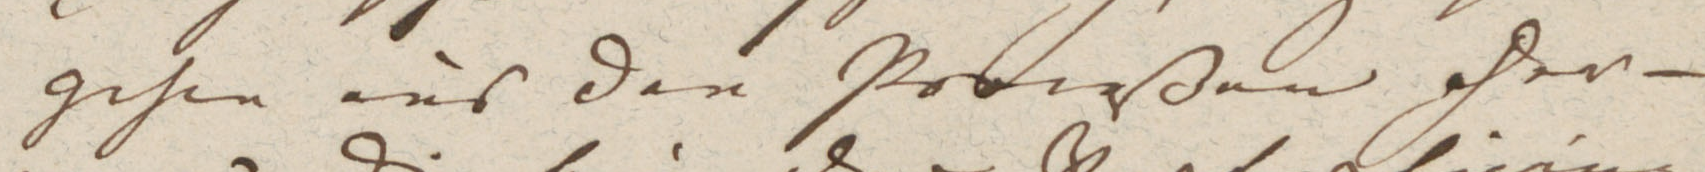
gehen aus den Processen dher-
